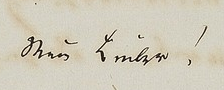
Mein Lieber!
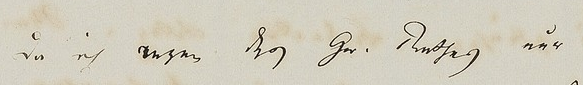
Da ich wegen des Gr. Rathes nur
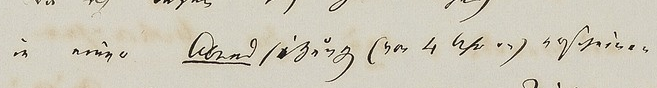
in einer Abendsitzung (von 4 Uhr an) erscheinen
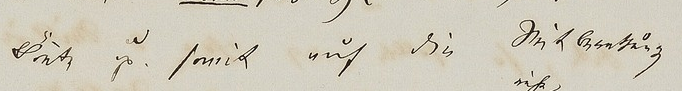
könnte &. somit auf die Mitwirkung
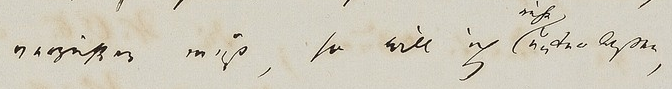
verzichten muß, so will ich nicht unterlaßen,
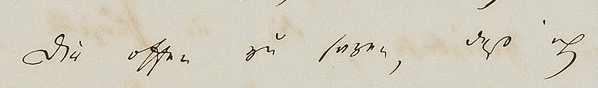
Dir offen zu sagen, daß ich
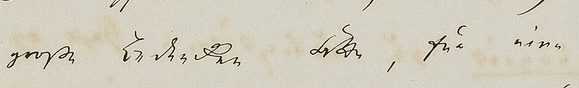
große Bedenken hätte, für eine
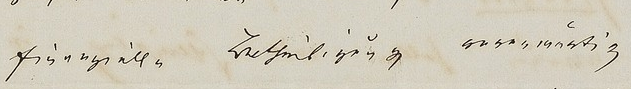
finanzielle Betheiligung gegenwärtig
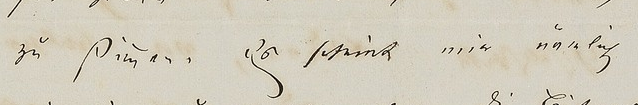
zu stimmen. Es scheint mir nämlich
